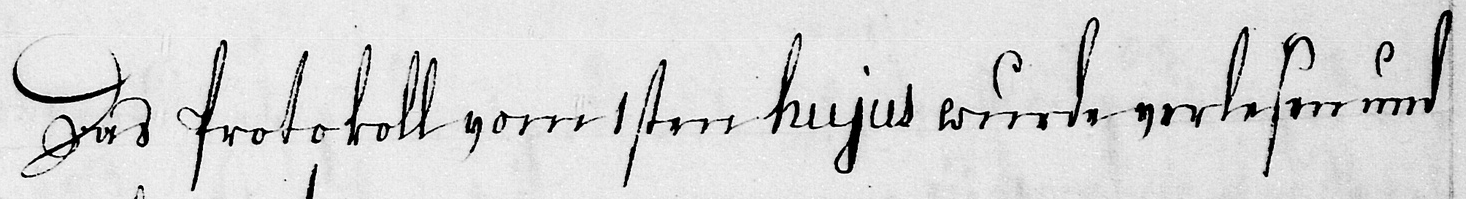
Das Protokoll vom 1sten hujus wurde verlesen und
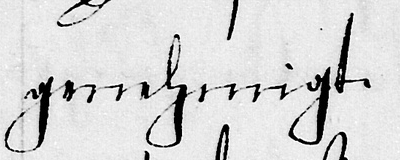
genehmigt.
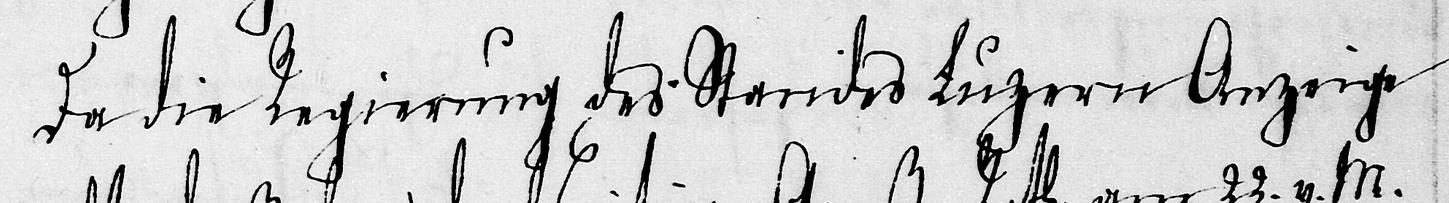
Da die Regierung des Standes Luzern Anzeige
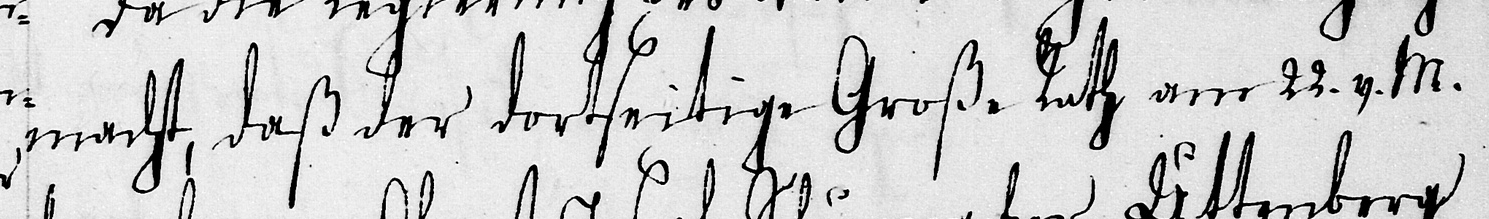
macht, daß der dortseitige Große Rath am 22. v. M.
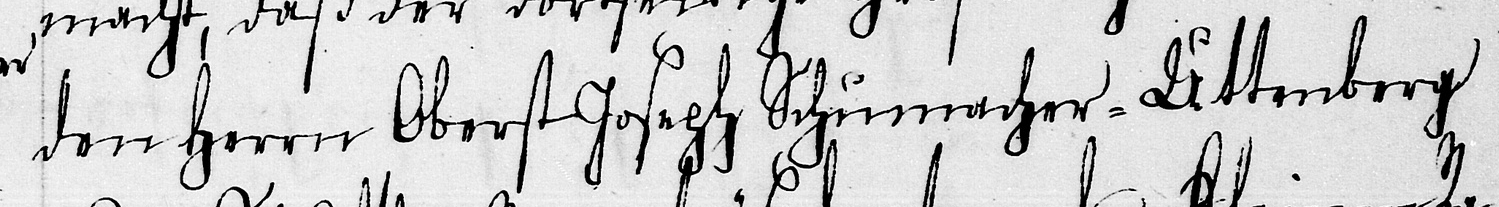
den Herrn Oberst Joseph Schumacher-Uttenberg
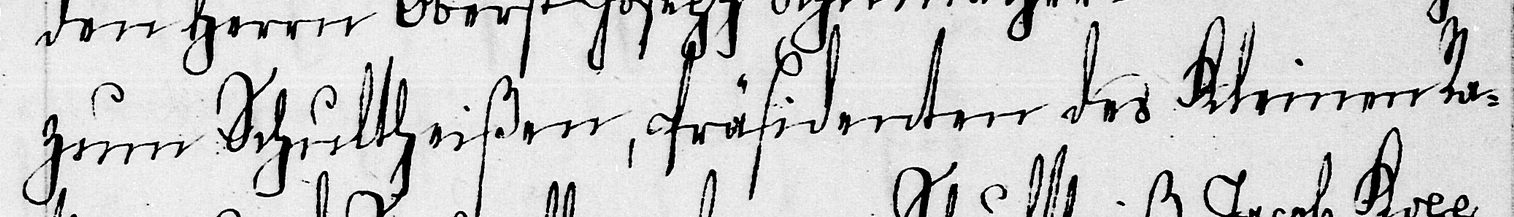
zum Schultheißen, Präsidenten des Kleinen Ra¬
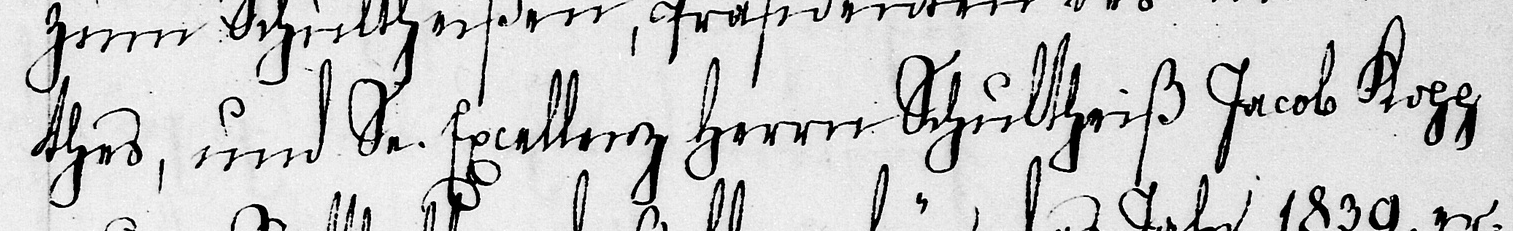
thes, und Se. Excellenz Herrn Schultheiß Jacob Kopp
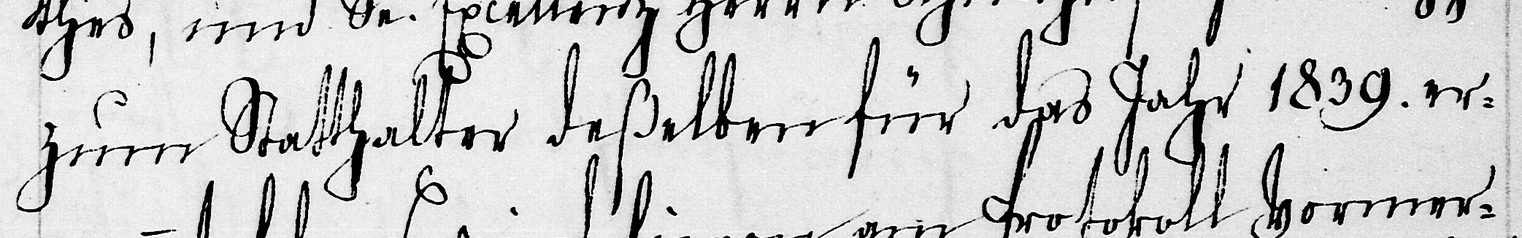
zum Statthalter deßelben für das Jahr 1839. er¬
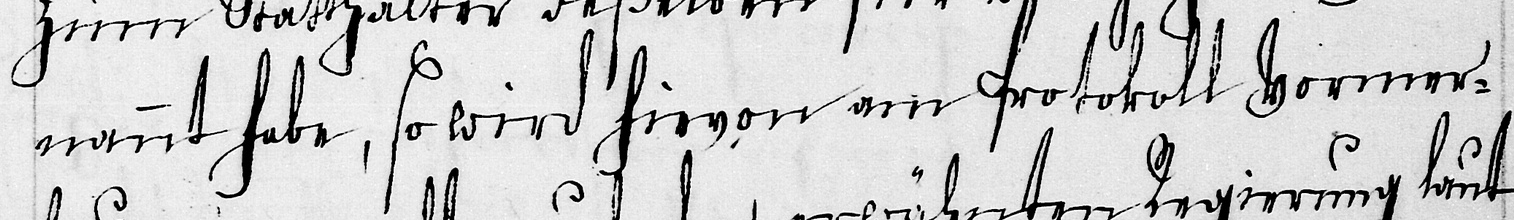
nannt habe, so wird hievon am Protokoll Vormer¬
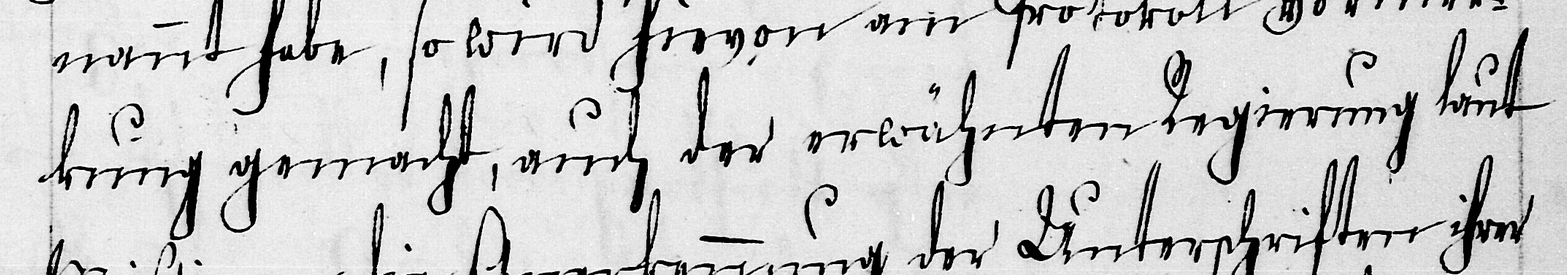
kung gemacht, auch der erwähnten Regierung laut
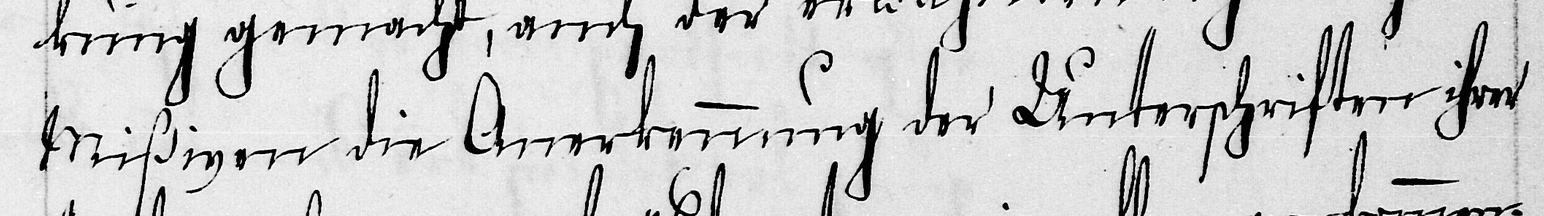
Mißiven die Anerkennung der Unterschriften ihrer
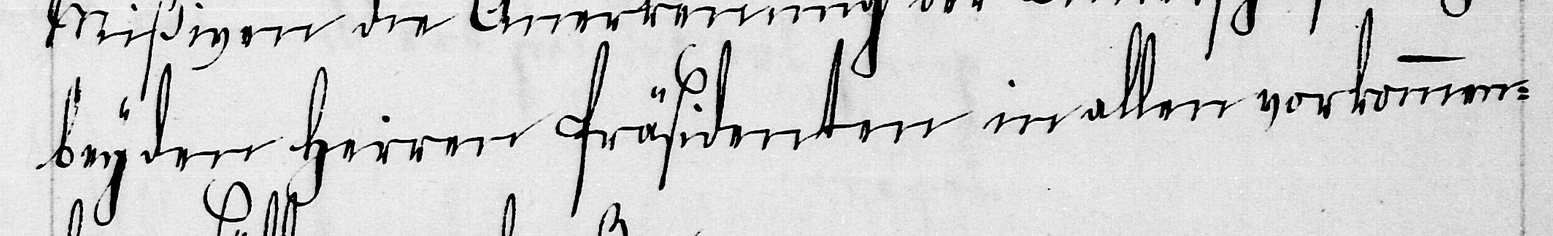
beyden Herren Präsidenten in allen vorkommen¬
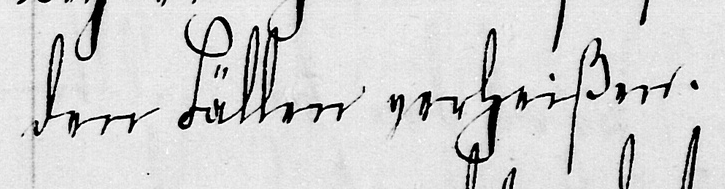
den Fällen verheißen.
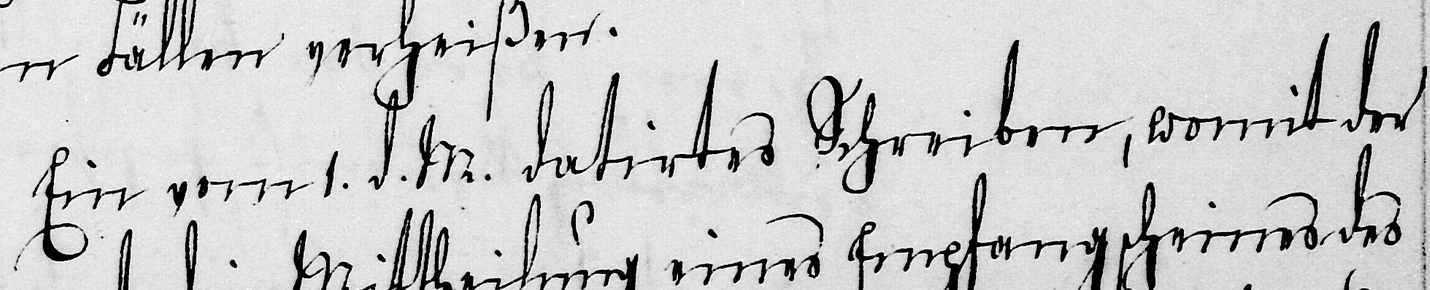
Ein vom 1. d. M. datirtes Schreiben, womit der
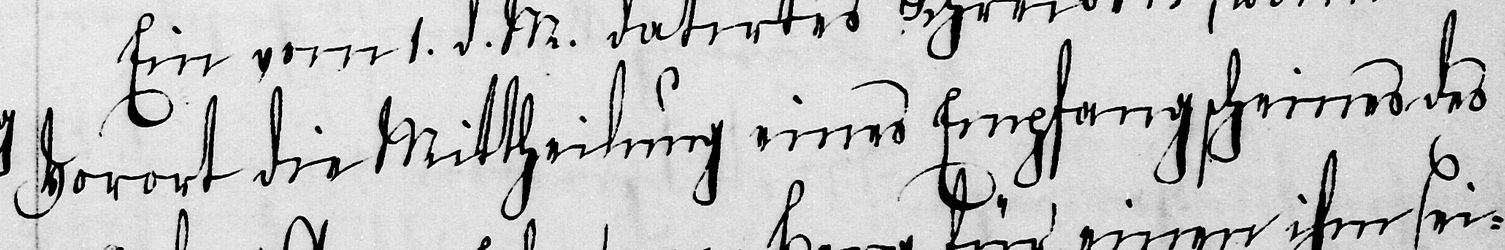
Vorort die Mittheilung eines Empfangscheines des
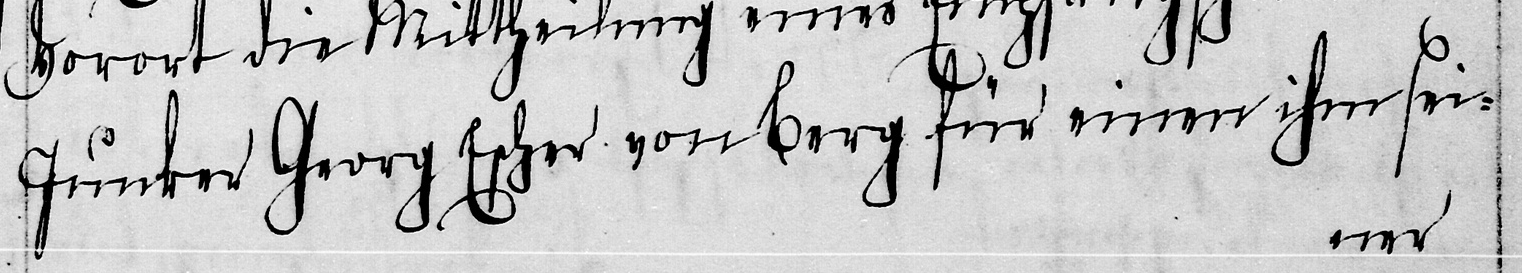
Junker Georg Escher von Berg für einen ihm sei-
